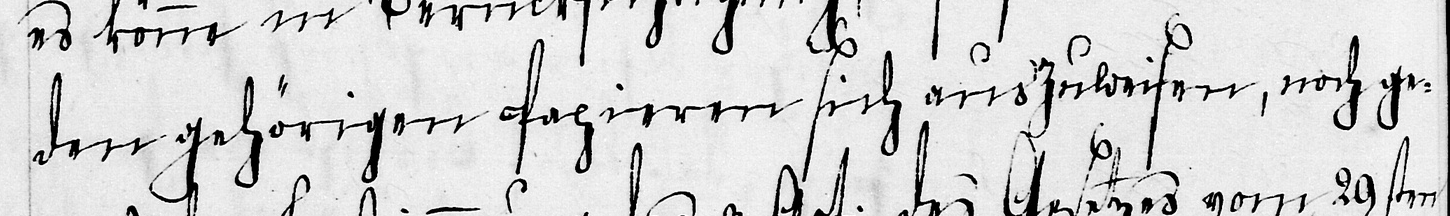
den gehörigen Papieren sich auszuweisen, noch ge¬
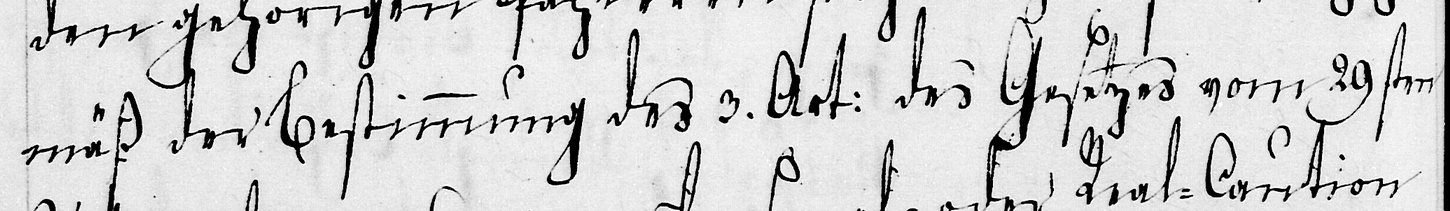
mäß der Bestimmung des 3. Art: des Gesetzes vom 29sten
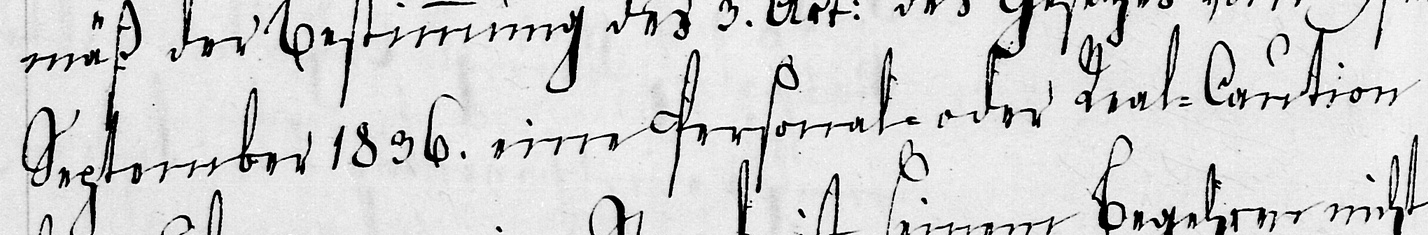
September 1836. eine Personal- oder Real-Caution
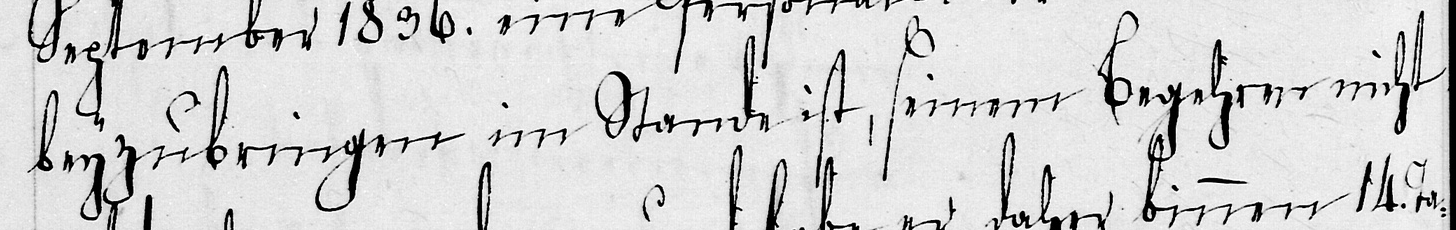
beyzubringen im Stande ist, seinem Begehren nicht
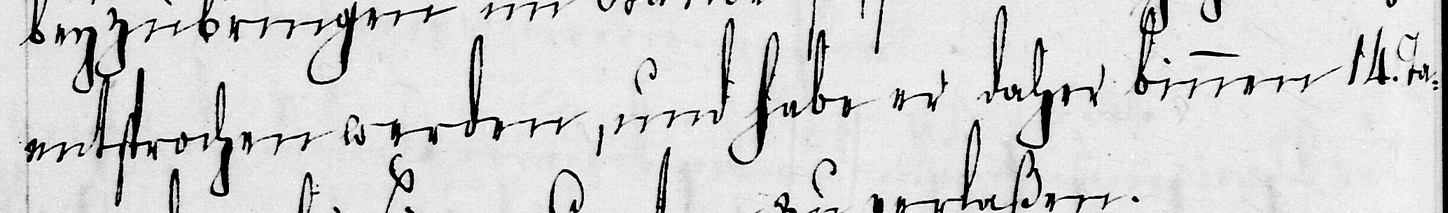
entsprochen werden, und habe er daher binnen 14. T¬
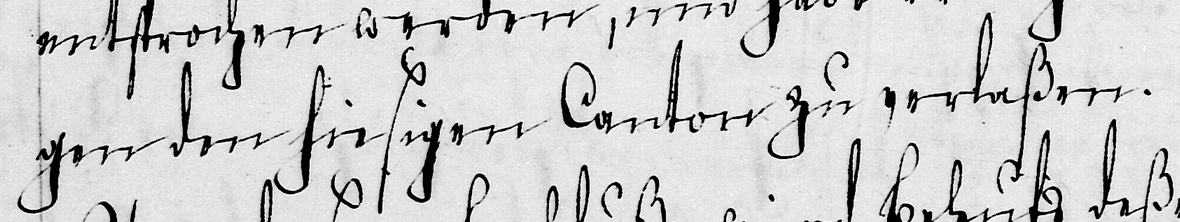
agen den hiesigen Canton zu verlaßen.
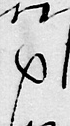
d.
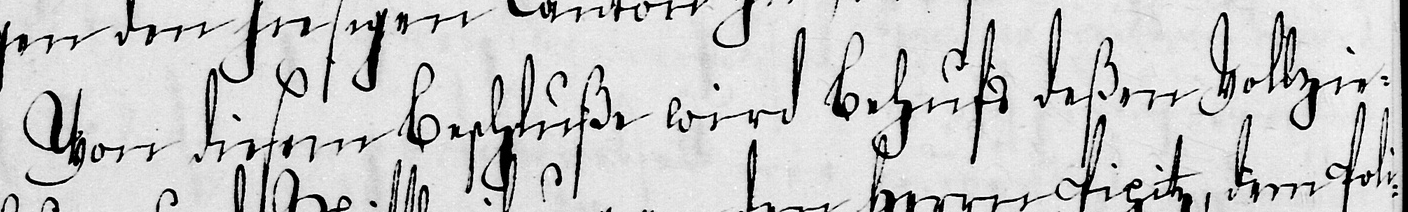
Von diesem Beschluße wird Behufs deßen Vollzie¬
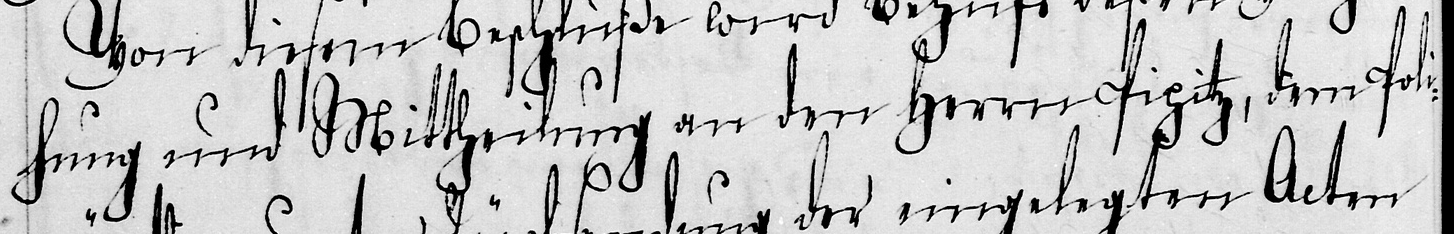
hung und Mittheilung an den Herrn Pipitz, dem Po¬
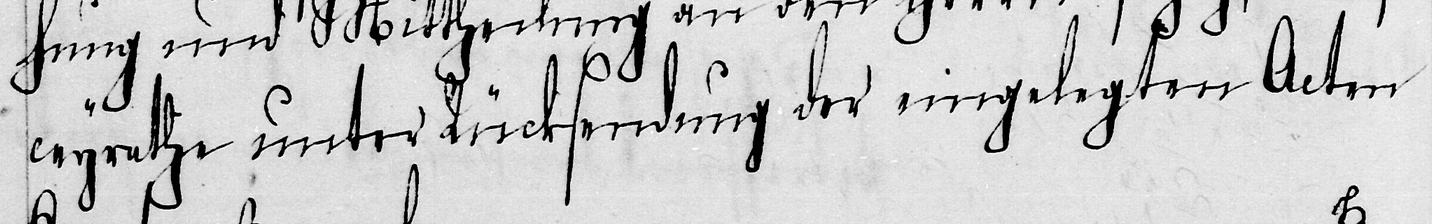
ceyrathe unter Rücksendung der eingelegten Acten
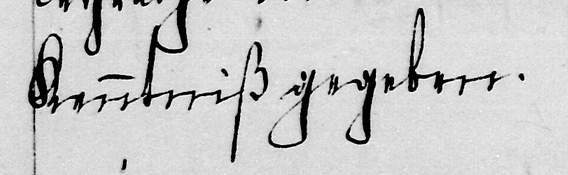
Kenntniß gegeben.
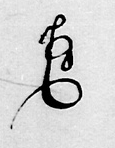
li¬
